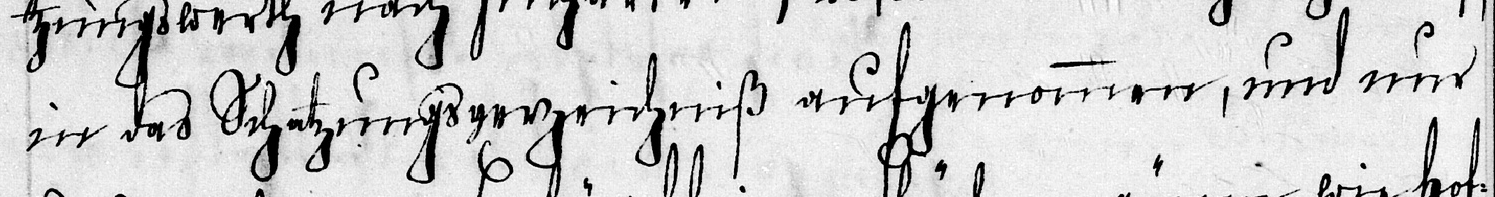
in das Schatzungsverzeichniß aufgenommen, und nur
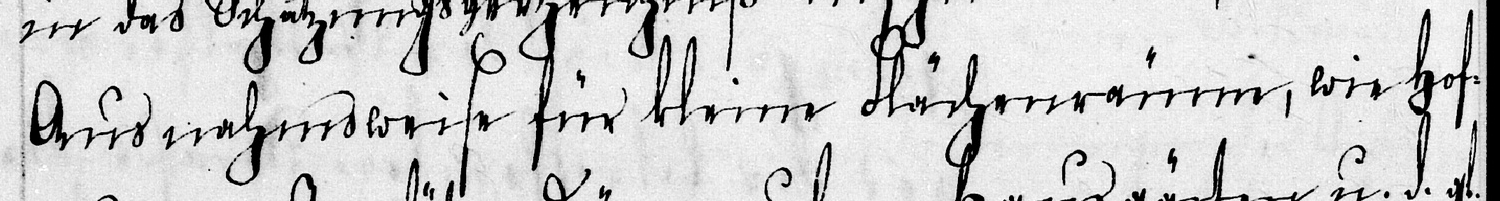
Ausnahmsweise für kleine Flächenräume, wie Hof¬
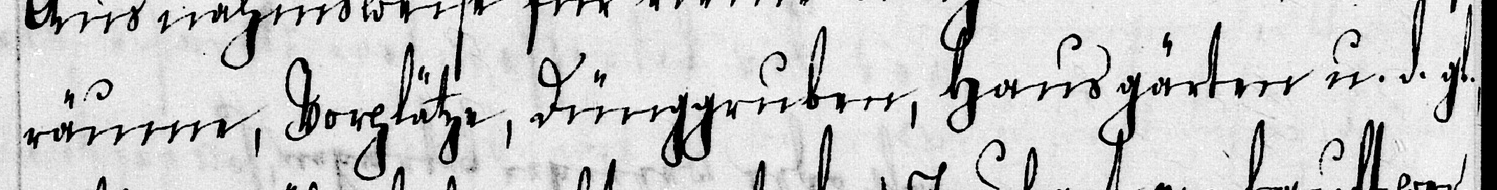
räume, Vorplätze, Dünggruben, Hausgärten u. d. gl.
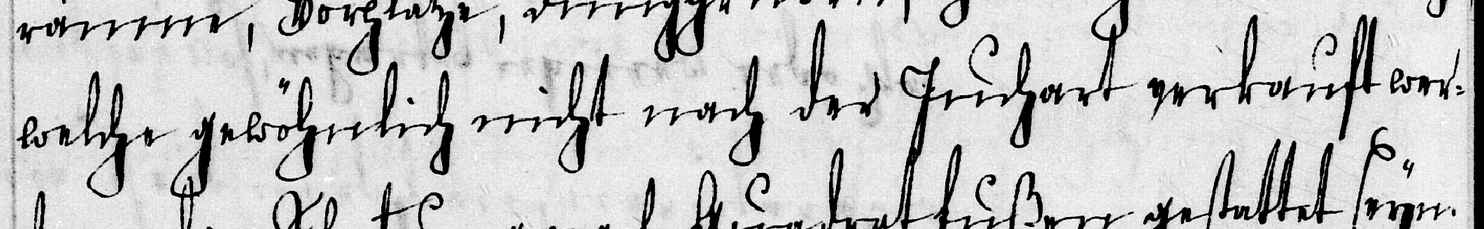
welche gewöhnlich nicht nach der Juchart verkauft wer¬
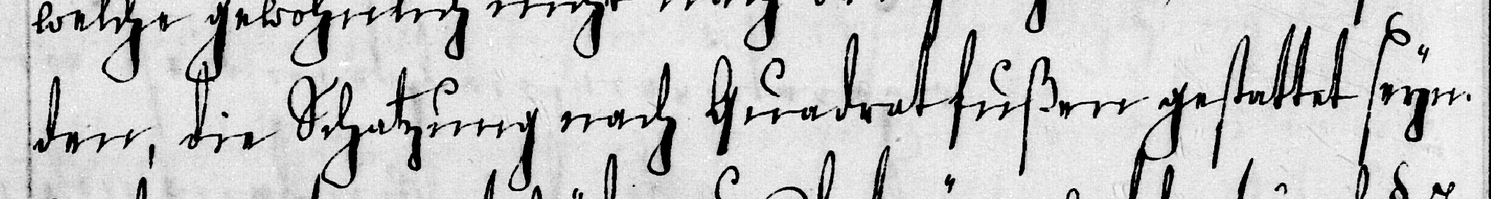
den, die Schatzung nach Quadratfußen gestattet seyn.
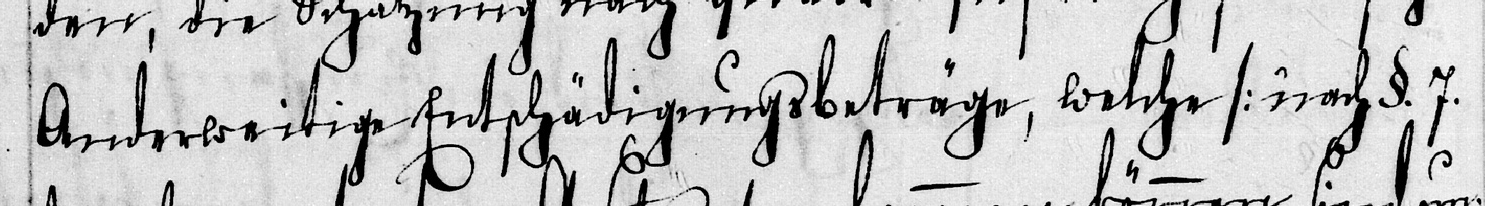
Anderweitige Entschädigungsbeträge, welche [nach §.
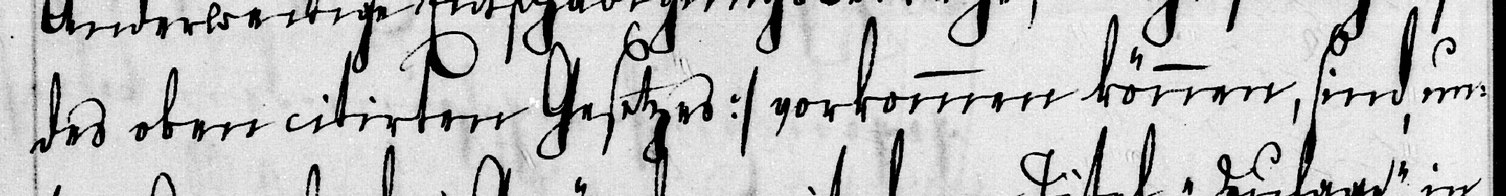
des oben citirten Gesetzes] vorkommen können, sind un¬
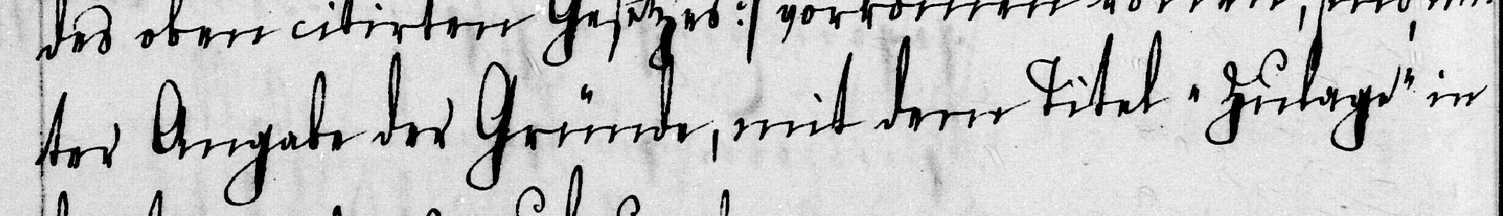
ter Angabe der Gründe, mit dem Titel „Zulage“ in
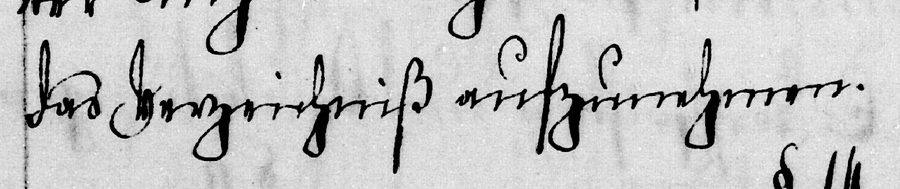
das Verzeichniß aufzunehmen.
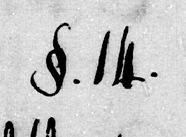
§. 14.
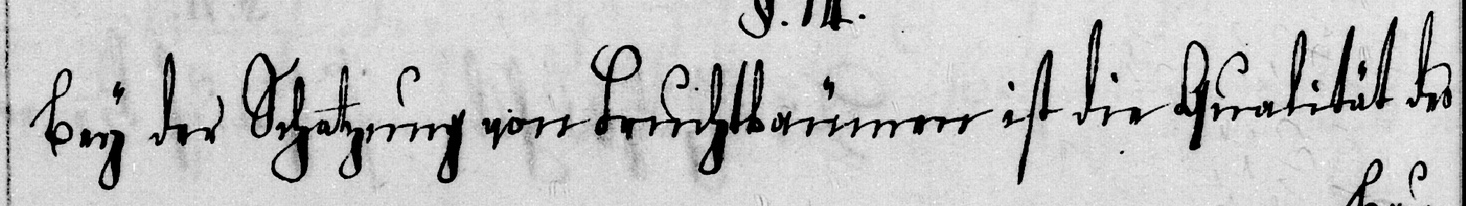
Bey der Schatzung von Fruchtbäumen ist die Qualität d¬
